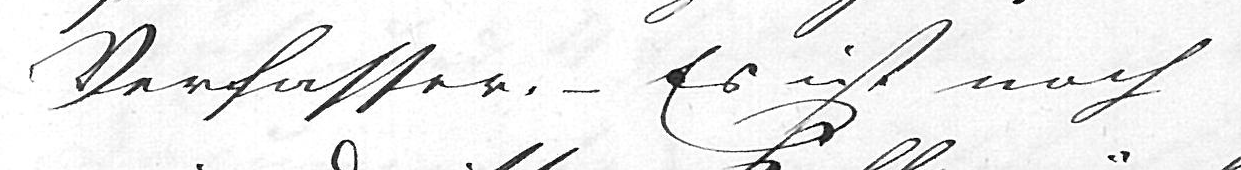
Verfasser. Es ist noch
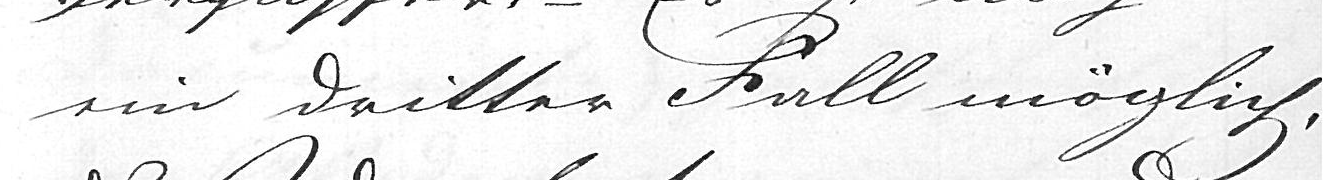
ein dritten Fall möglich,
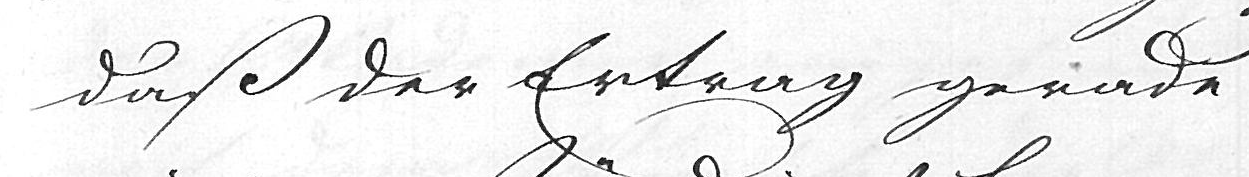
daß der Ertrag gerade
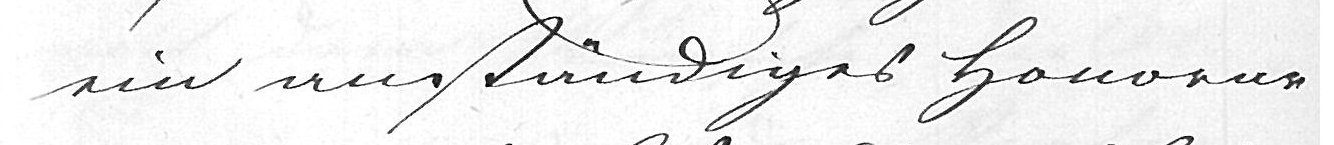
ein anständiges Honorar
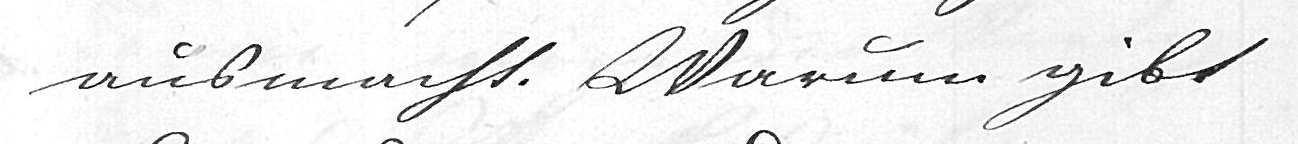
ausmacht. Warum geben
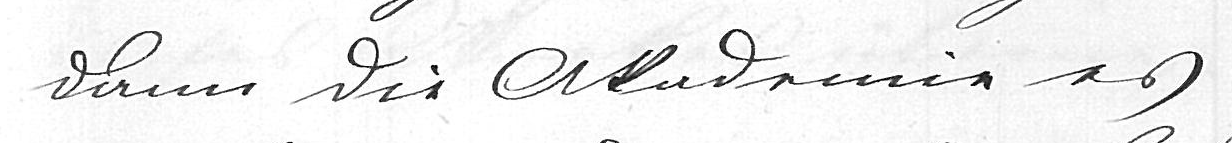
dann die Akademie es
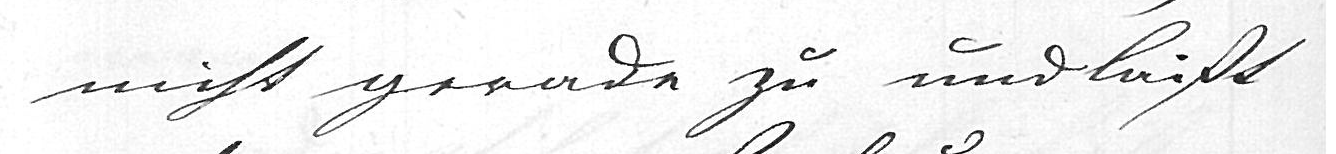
nicht gerade zu und laist
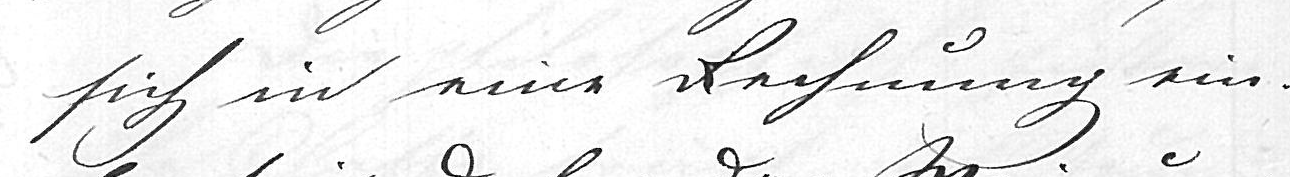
sich in eine Rechnung ein.
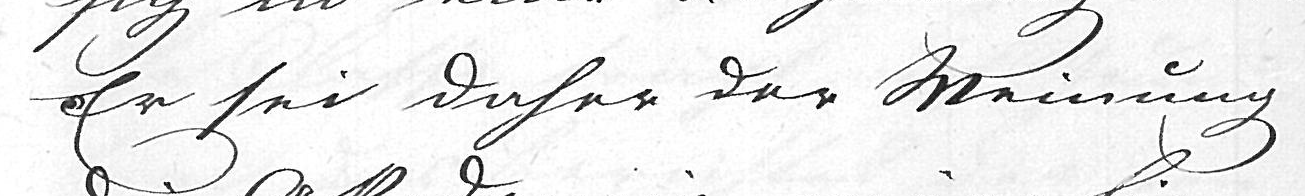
Er sei daher der Meinung
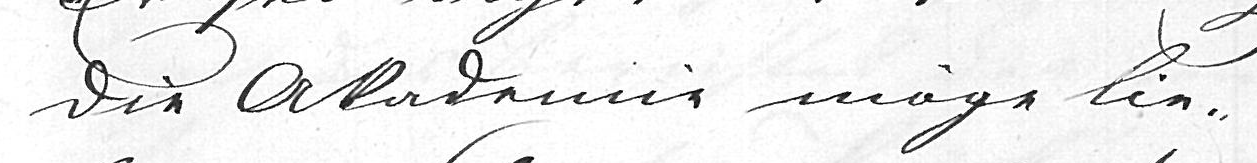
die Akademie möge lie-
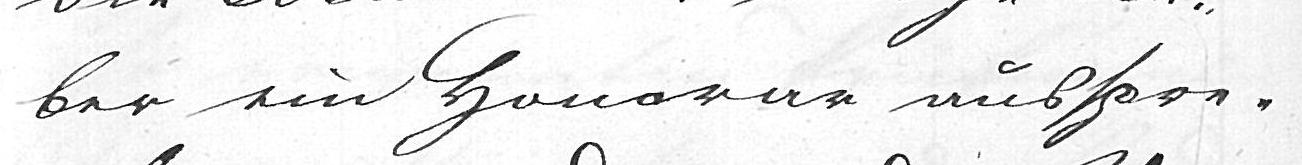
ber ein Honorar ausspre-
